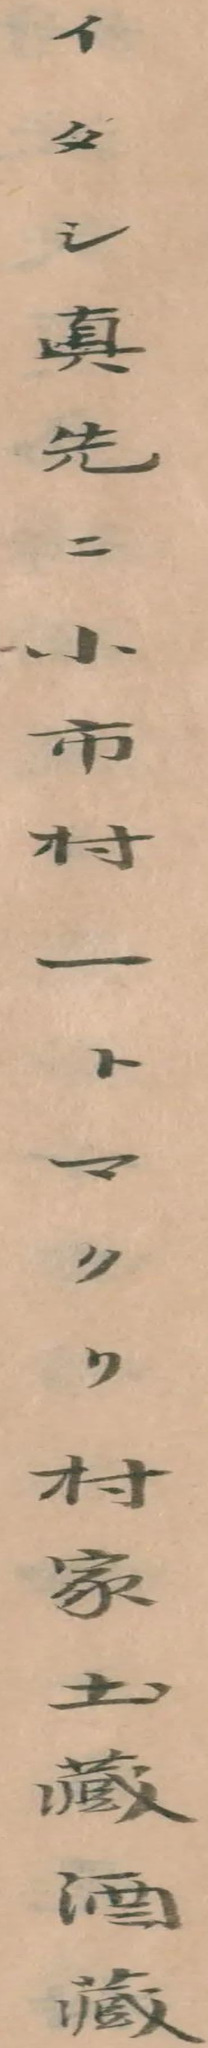イタシ真先ニ小市村一トマクリ村家土藏酒藏
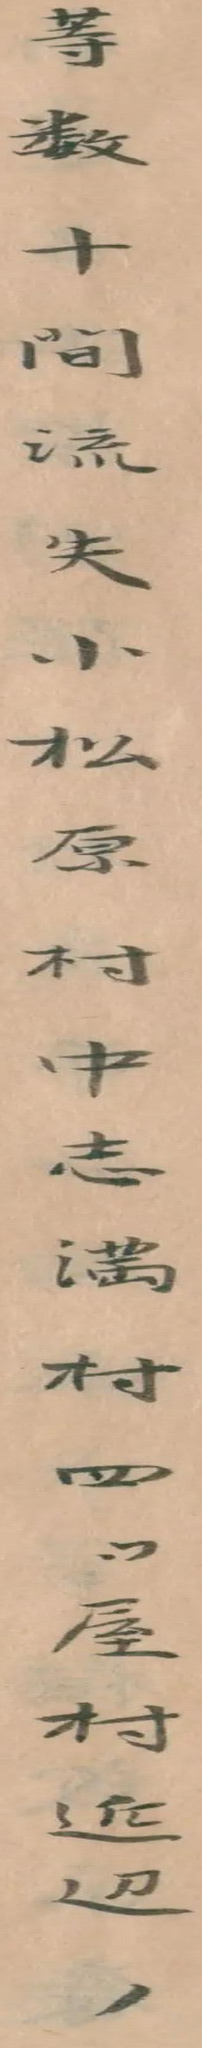等数十間流失小松原村中志満村四ツ屋村近辺ノ
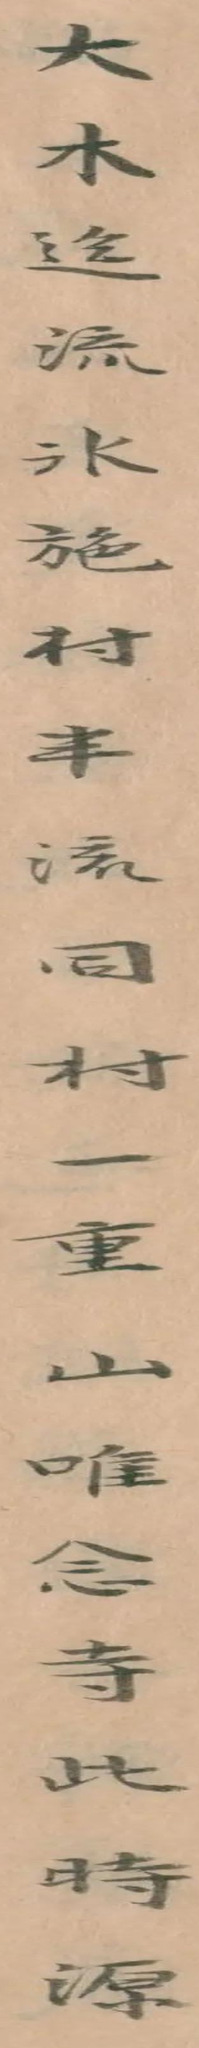大木迄流氷施村半流同村一重山唯念寺此時源

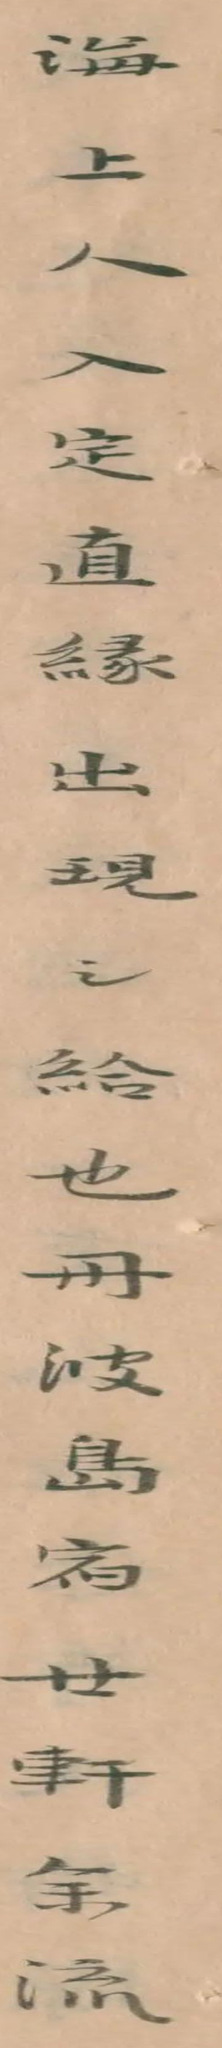海上人入定直縁出現シ給也丹波島宿廿軒余流
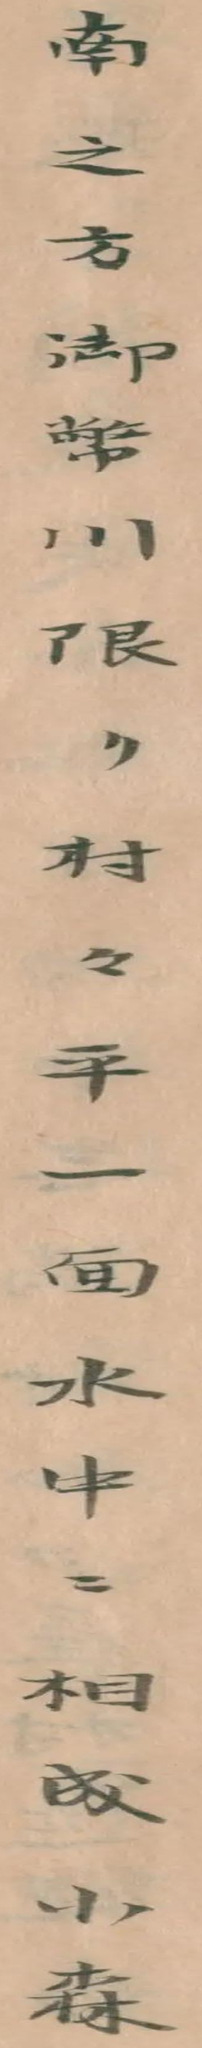南之方御幣川限リ村々平一面水中ニ相成小森
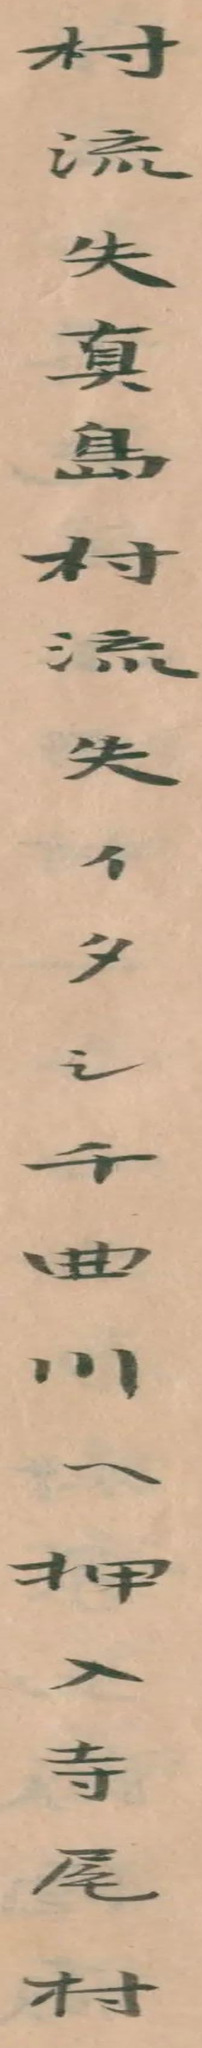村流失真島村流失イタシ千曲川ヘ押入寺尾村
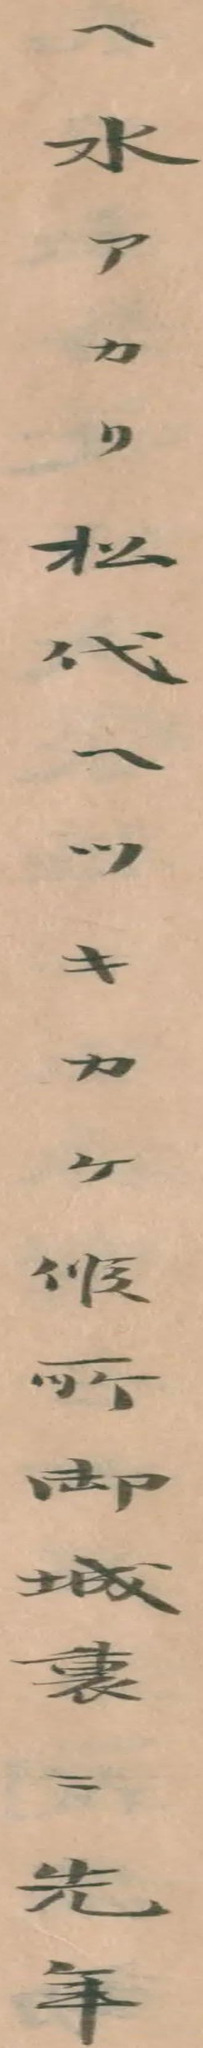ヘ水アカリ松代ヘツキカケ候所御城裏ニ先年
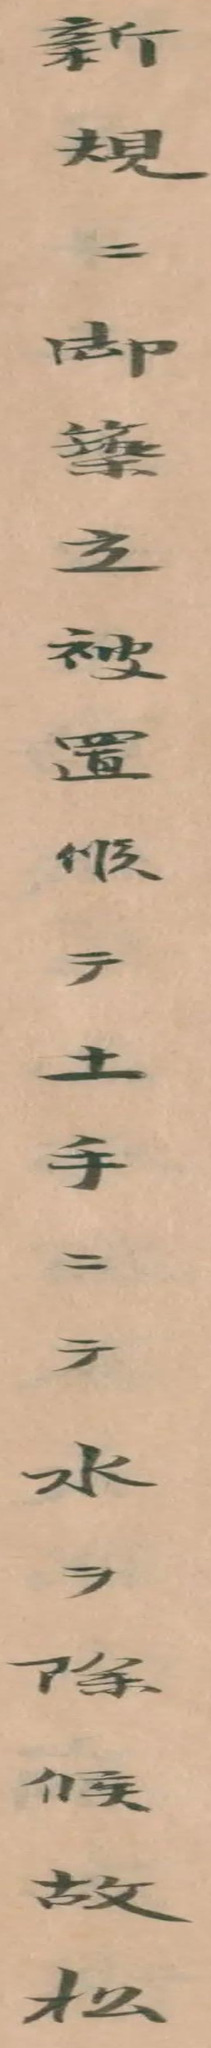新規ニ御築立被置候テ土手ニテ水ヲ除候故松
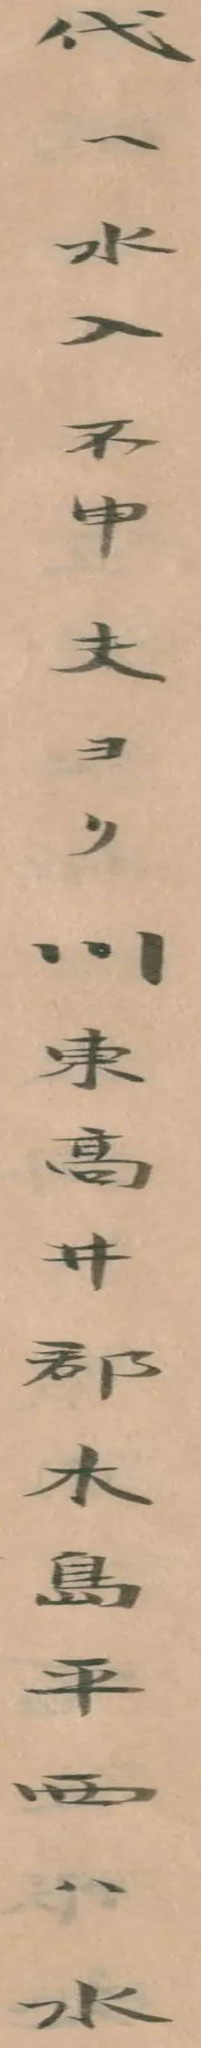代ヘ水入不申夫ヨリ川東高井郡木島平西ハ水
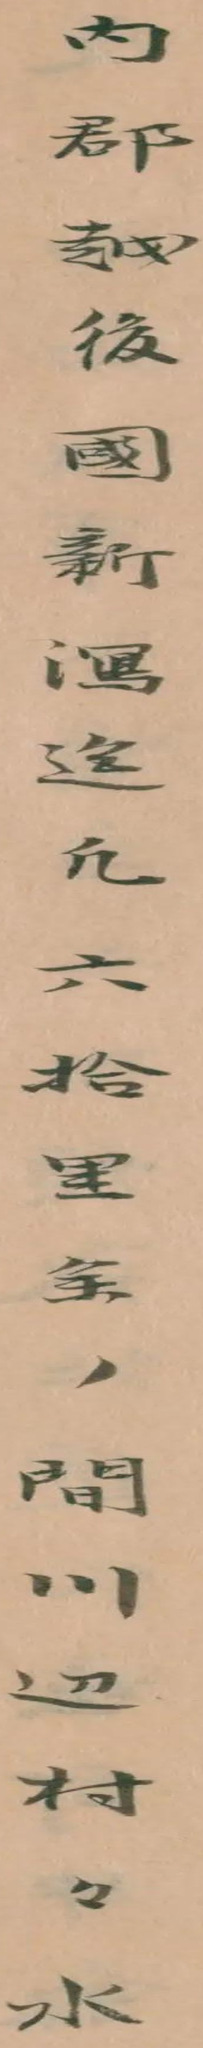内郡越後国新潟迄凡六十里余ノ間川辺村々水
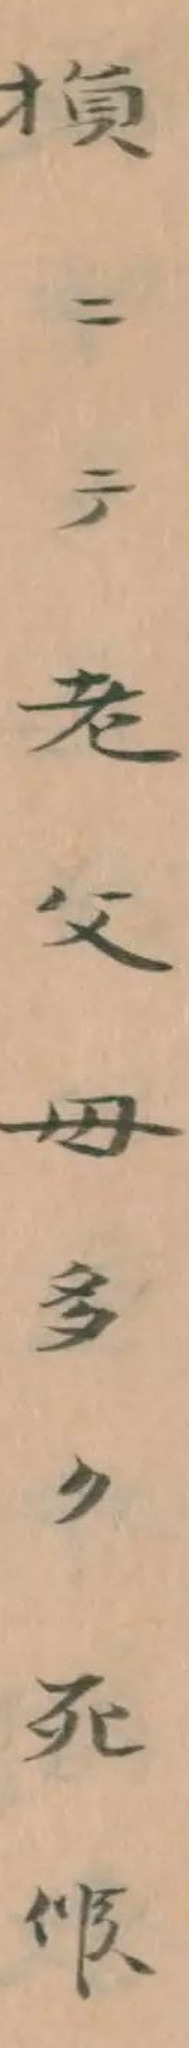損ニテ老父母多ク死候
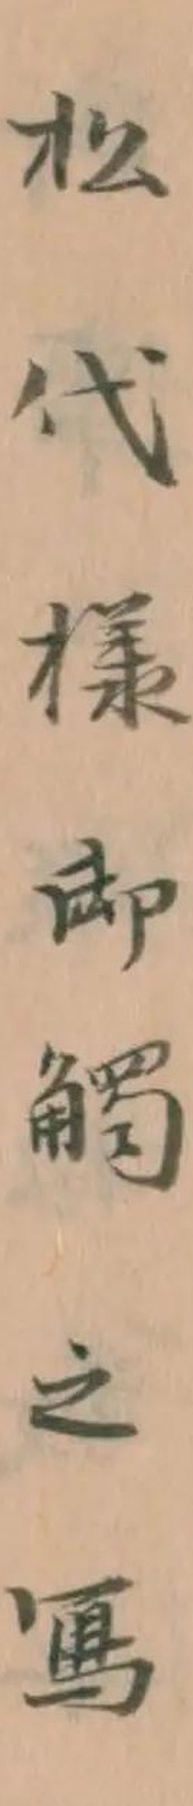松代様御触之写
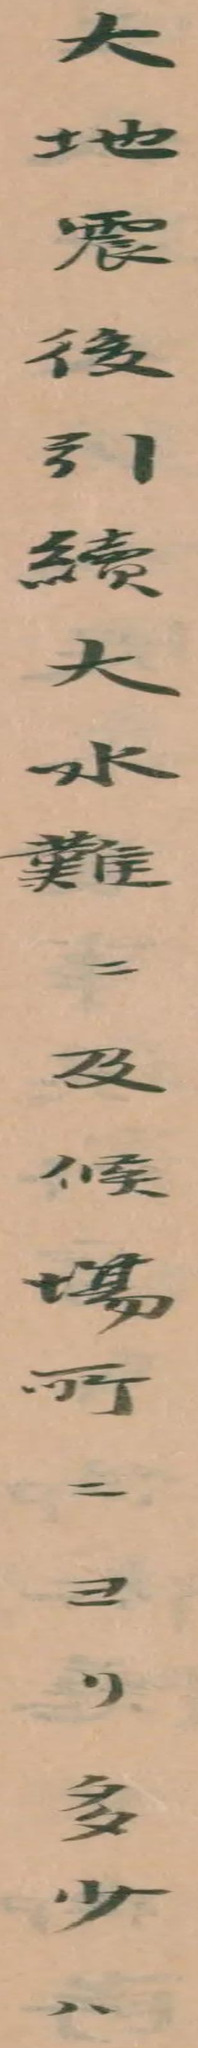大地震後引続大水難ニ及候場所ニヨリ多少ハ
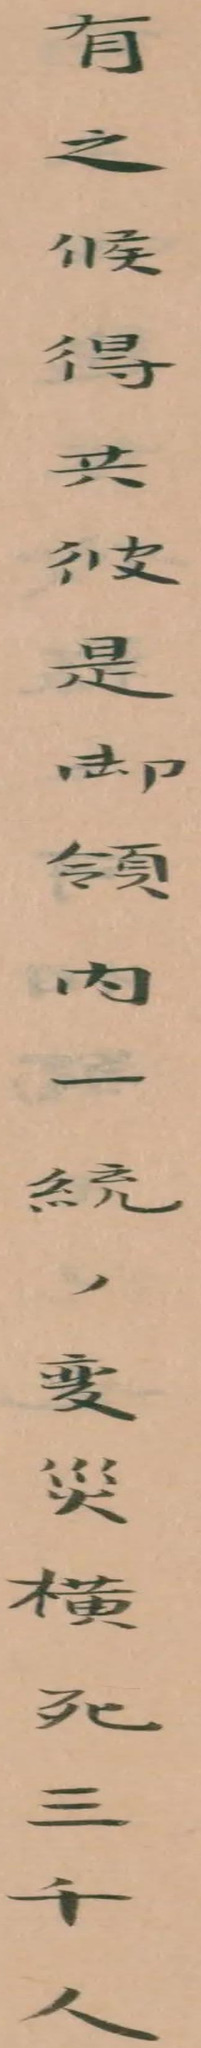有之候得共彼是御領内一統ノ変災横死三千人
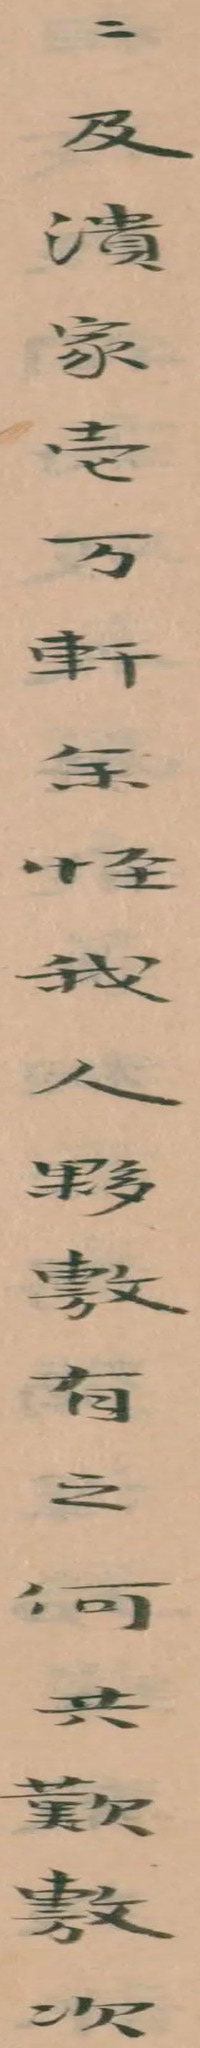ニ及潰家壱万軒余怪我人夥敷有之何共歎敷次
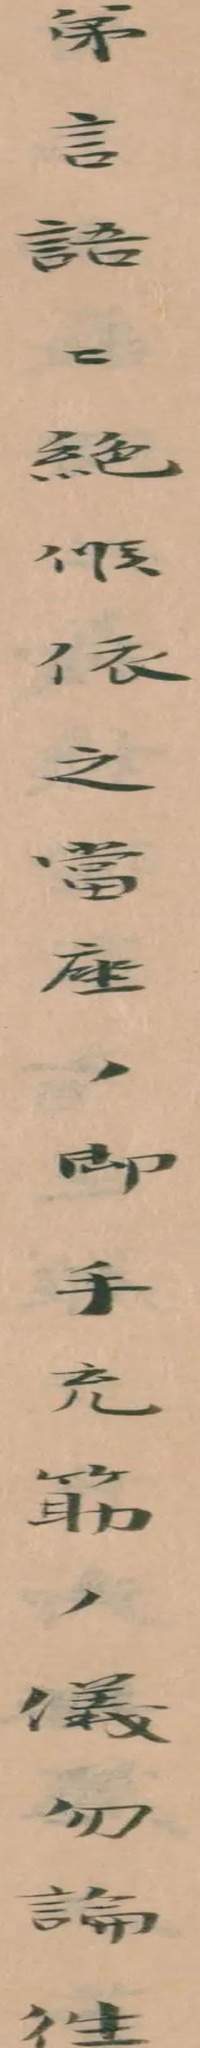第言語ニ絶候依之当座ノ御手充筋ノ儀勿論往
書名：地災撮要. 巻5-6(地震之部)
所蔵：国立国会図書館 National Diet Library, JAPAN
